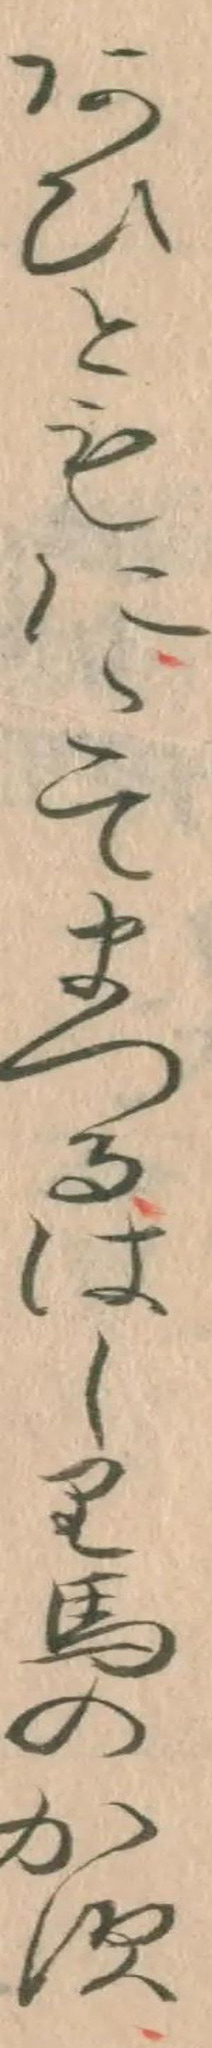あひともにたてまつるはしり馬のかす
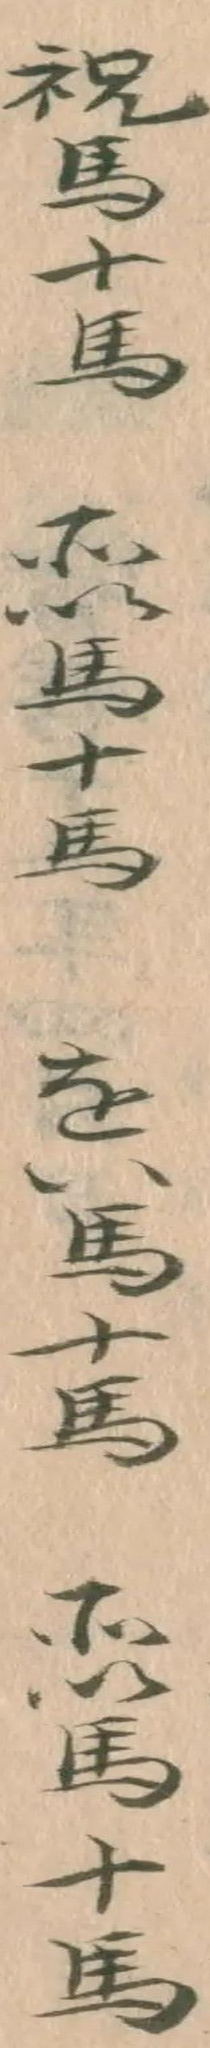祝馬十馬所以馬十馬をい馬十馬所以馬十馬
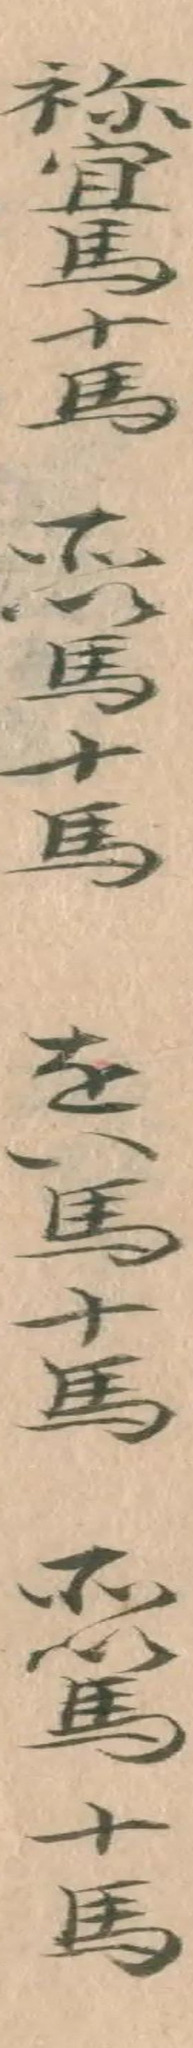祢宜馬十馬所以馬十馬をい馬十馬所以馬十馬
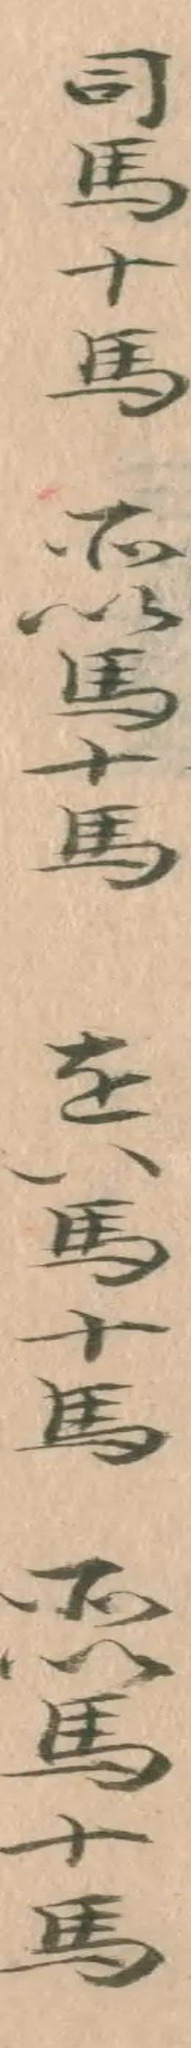司馬十馬所以馬十馬をい馬十馬所以馬十馬
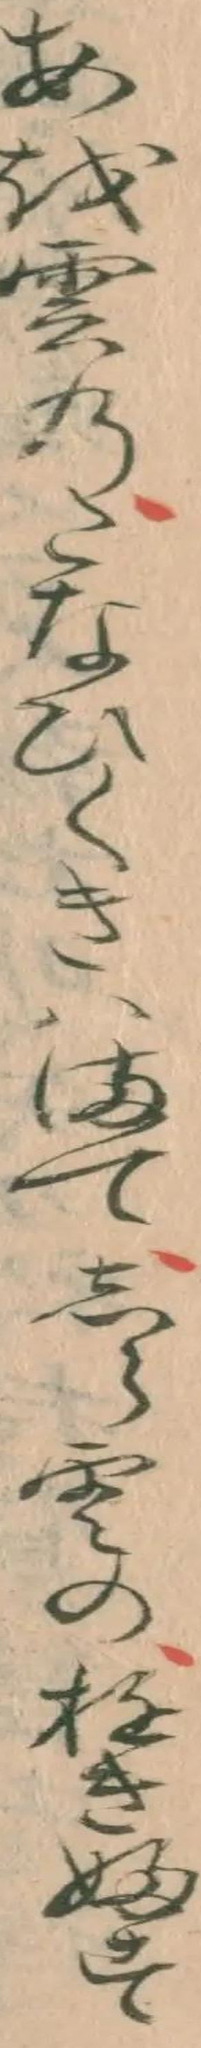あを雲のたなひくきハまてしら雲のゆきふす
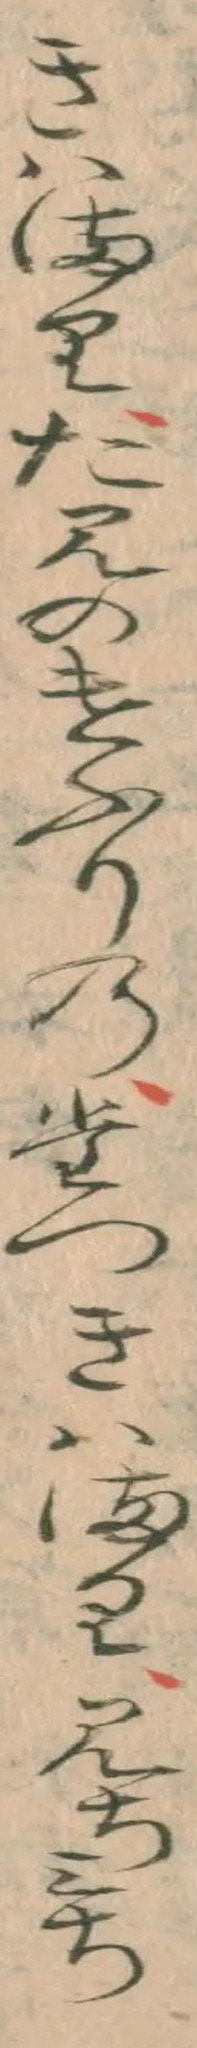きハまりたみのけふりのたつきハまりみちミち
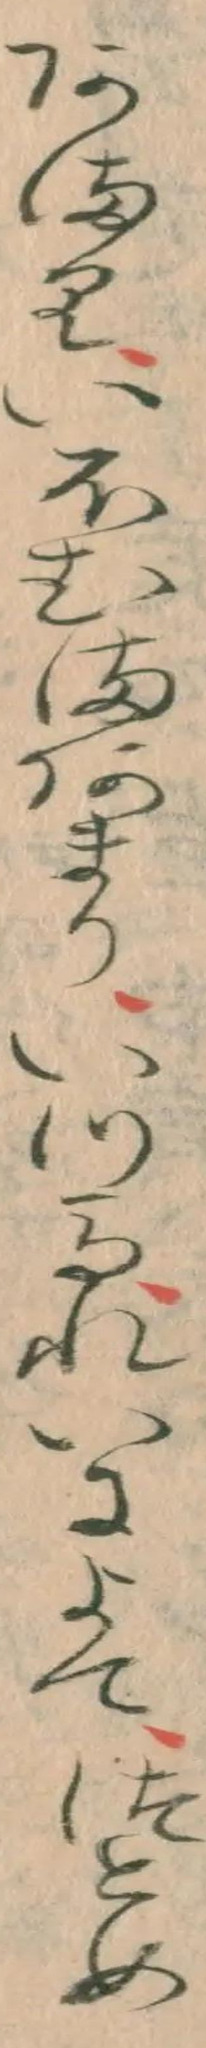あまりいほむまあまりいつ馬れいによてつとめ
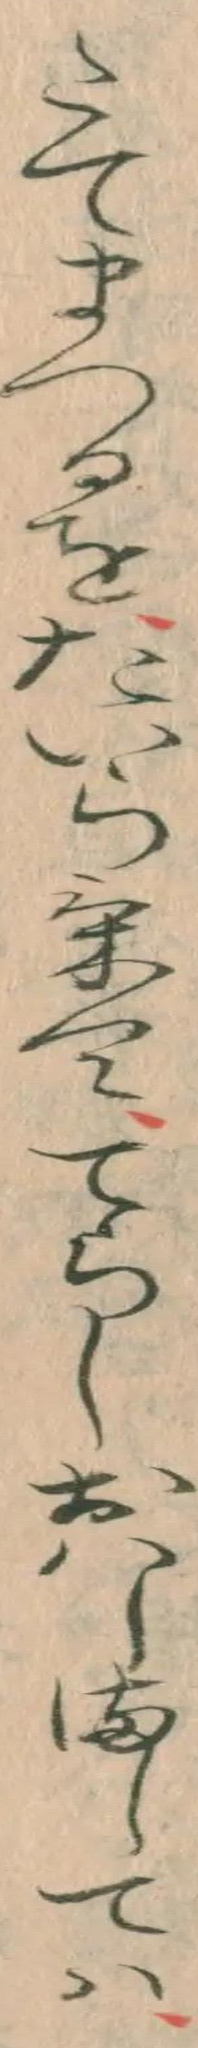たてまつるをたいらけててらしおハしましてハ
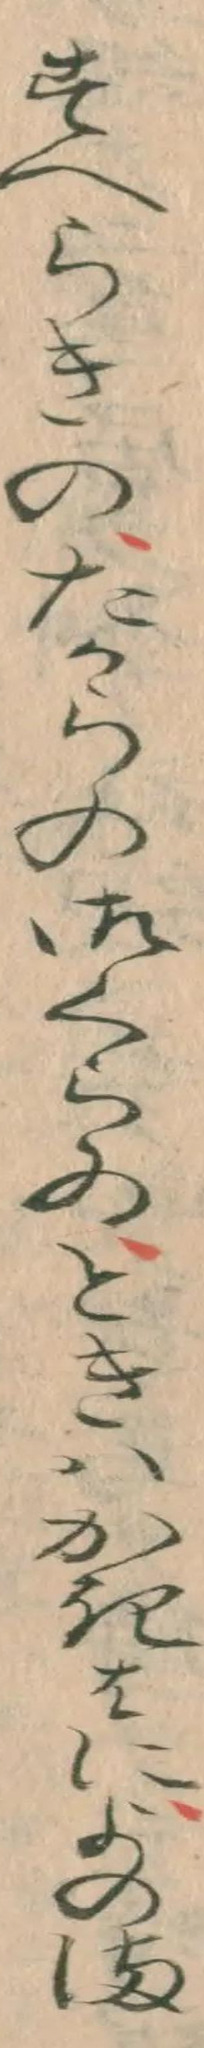すへらきのたからの御くらゐときハかきはによのま
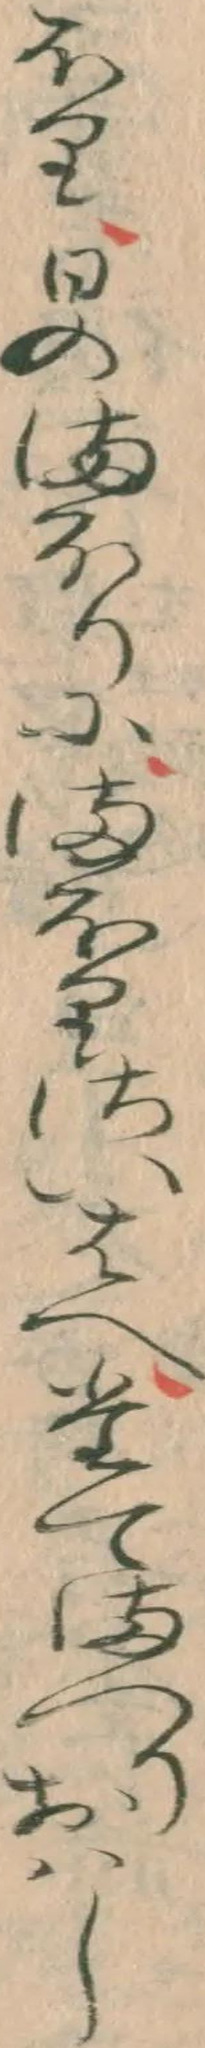ほり日のまほりにまほりさいはへたてまつりおハし
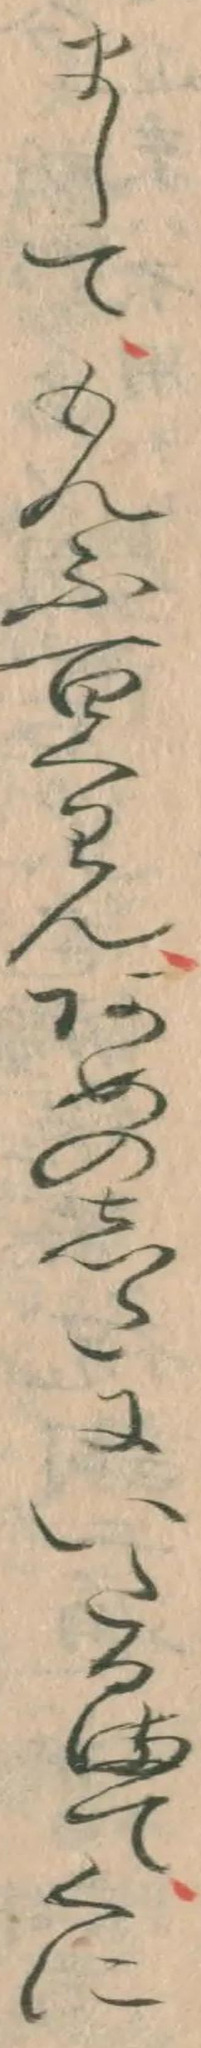ましてもんふ百くわんあめのしたにいたるまてくに
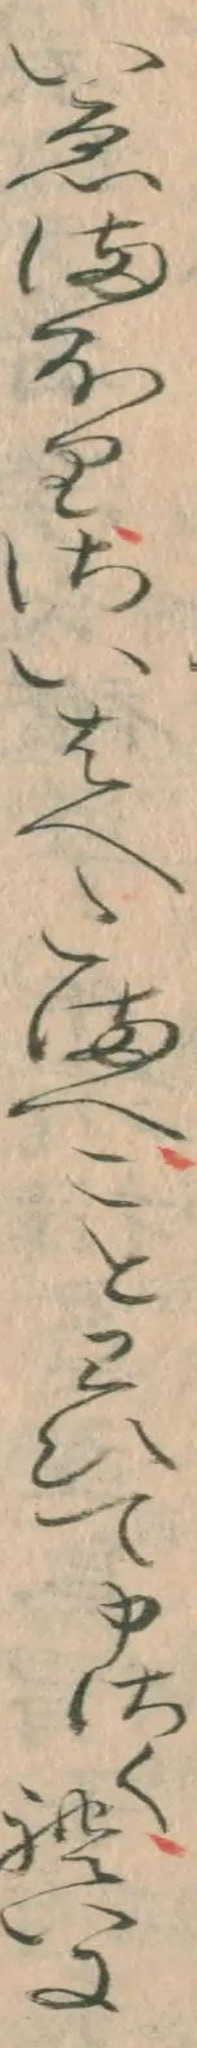いゑまほりさいはへたまへことわひて申さくれいに
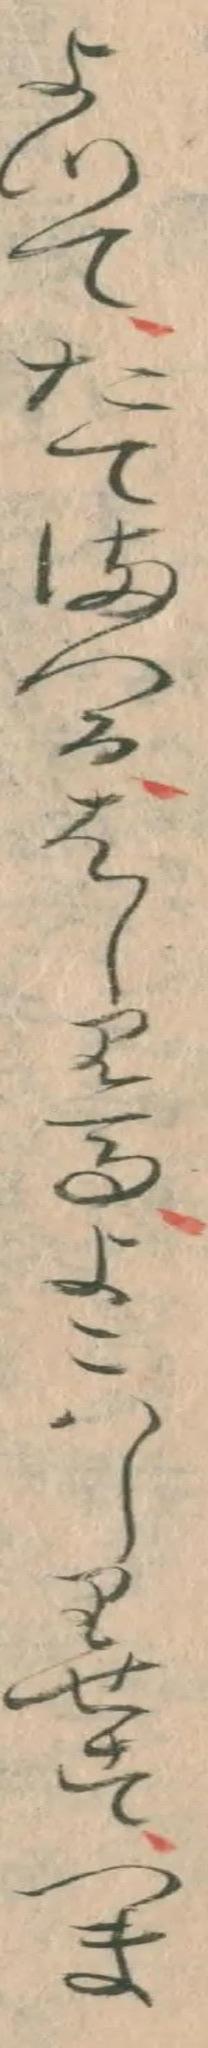よつてたてまつるはしり馬よこハしりせすつま
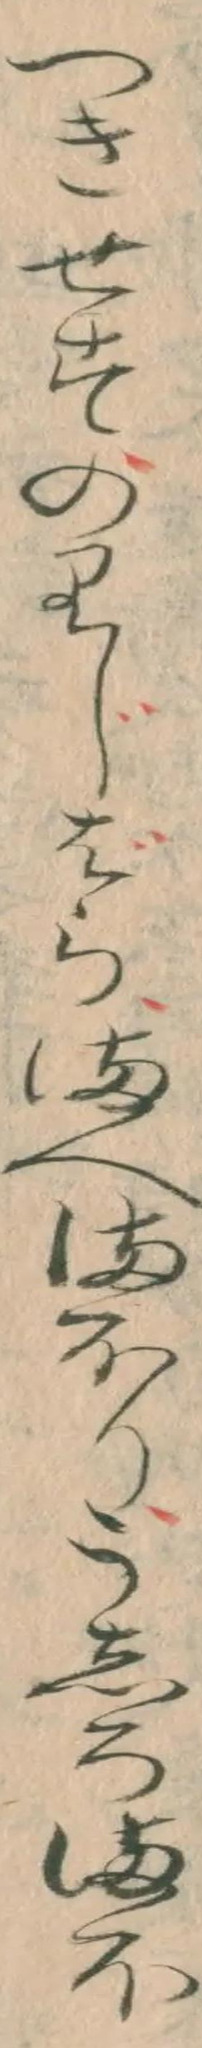つきせすのりしはらまへまほりうしろまほ
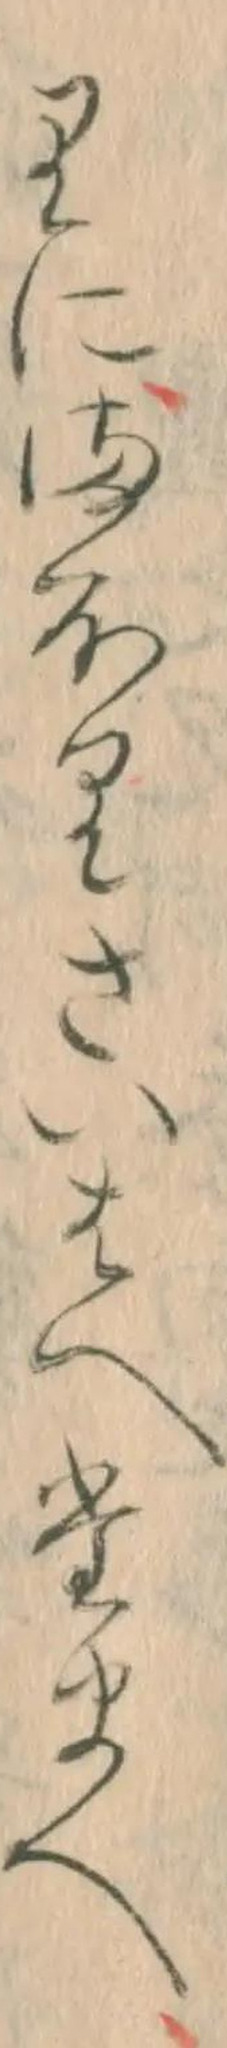りにまほりさいはへたまへ

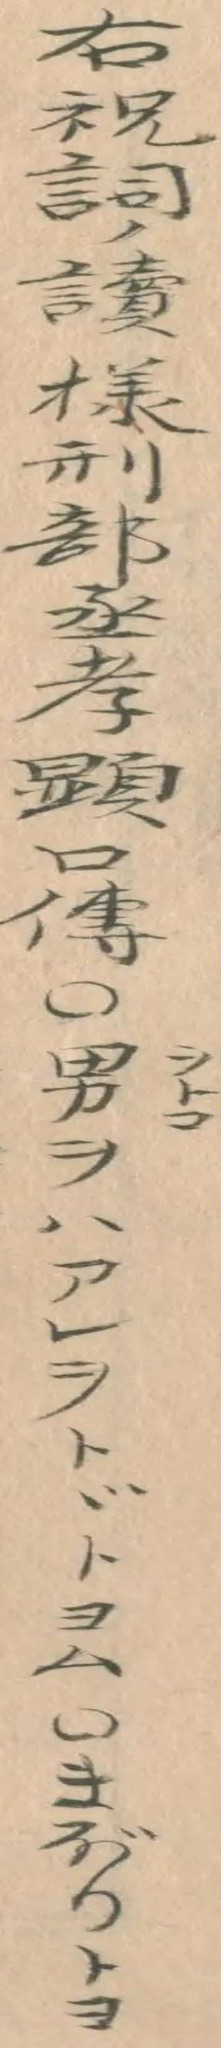右祝詞ノ讀様刑部丞孝顕口傳〇男ヲハアレヲトヾトヨム○まぼりトヨ
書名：賀茂社記録. 第40冊
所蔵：国立国会図書館 National Diet Library, JAPAN
